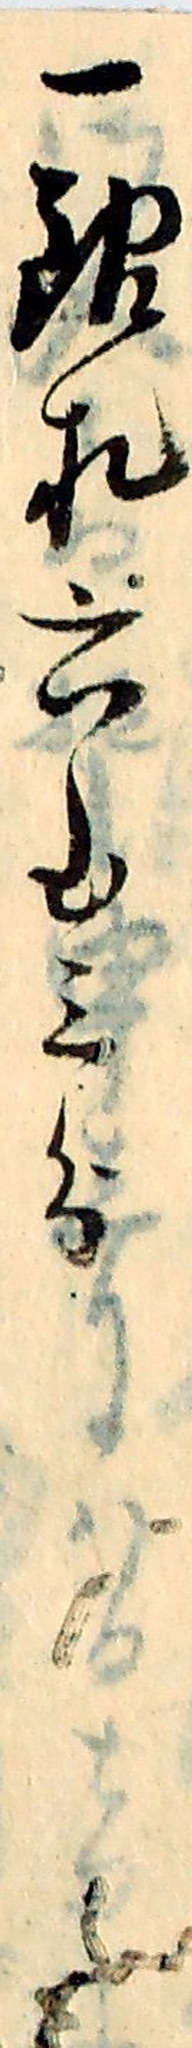一銀札六匁三分
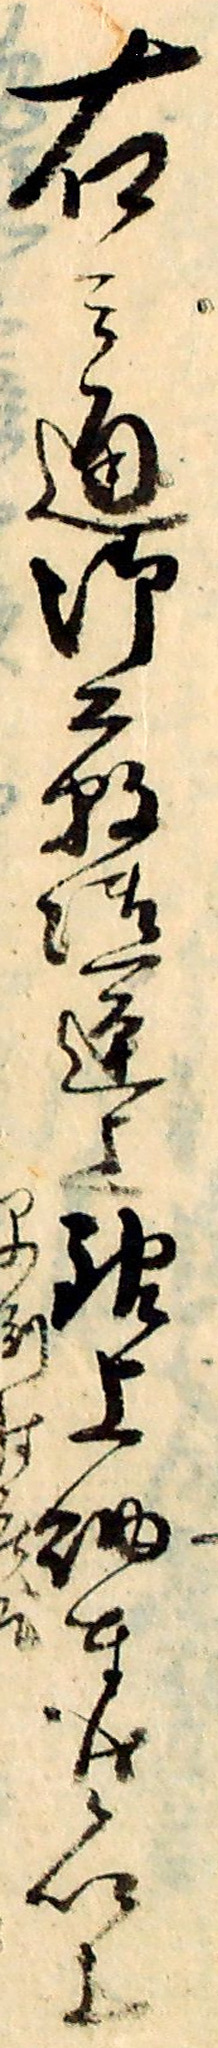右之通御藪御運上銀上納奉仕候以上
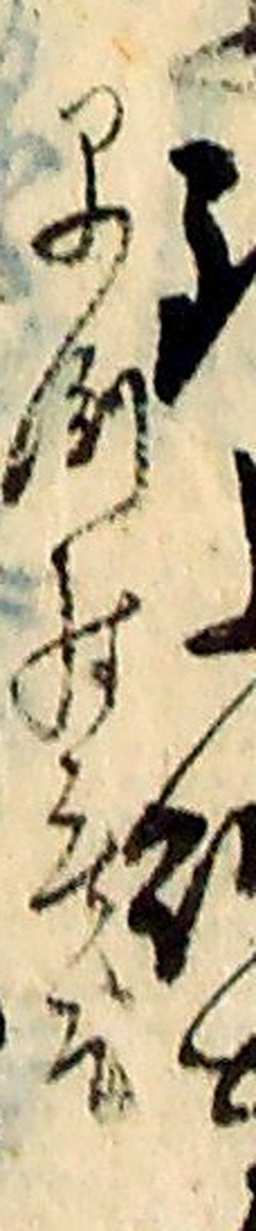早淵村庄屋
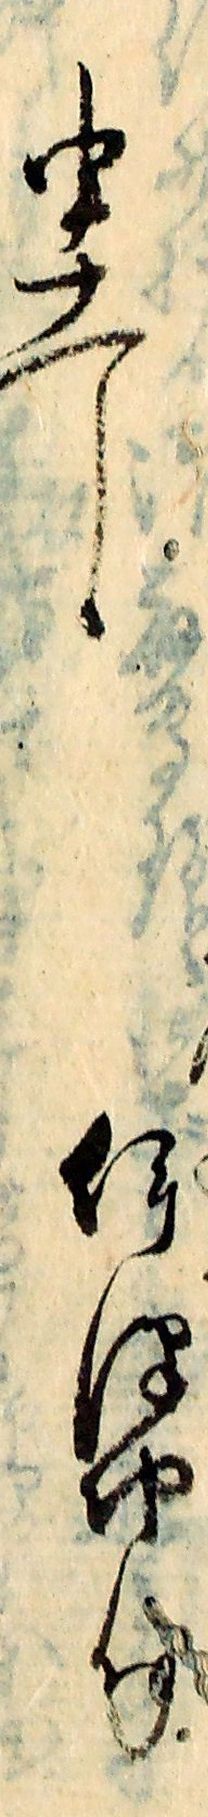申十一月伊沢仲助
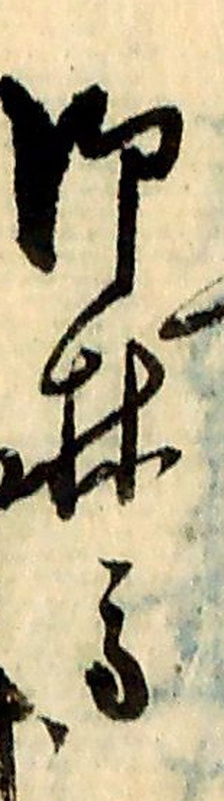御林方
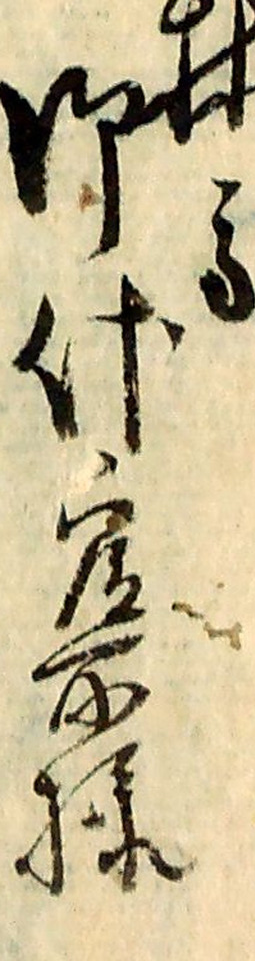御代官所様
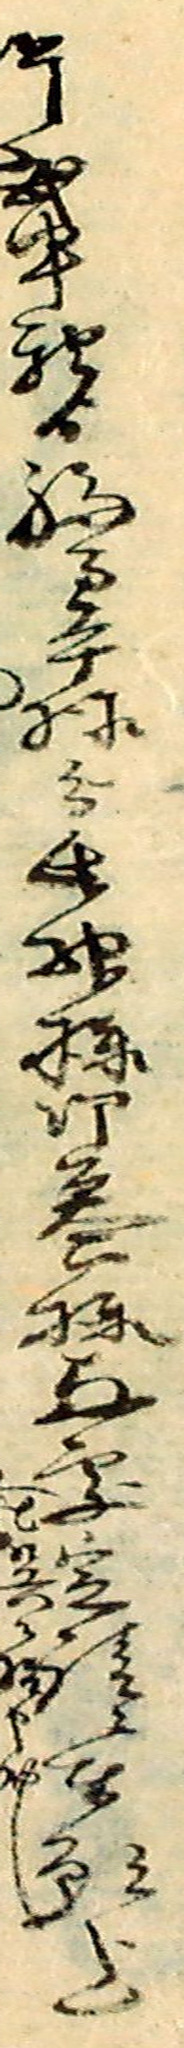但し当申秋ゟ福万寺様分氏神様御墓様両処定請に奉願上
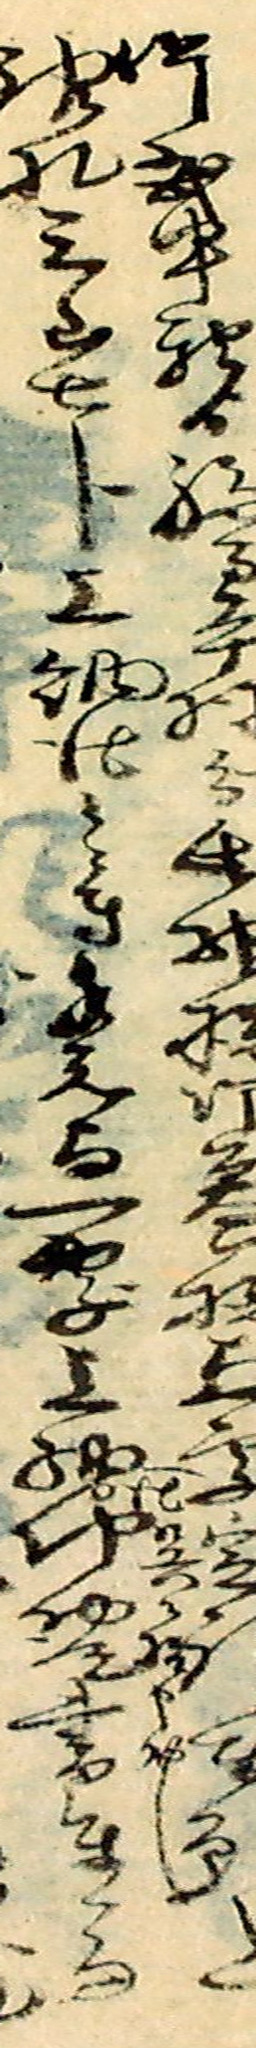銀札三匁七分上納仕候に付手元と一処上納仕呉候様申聞
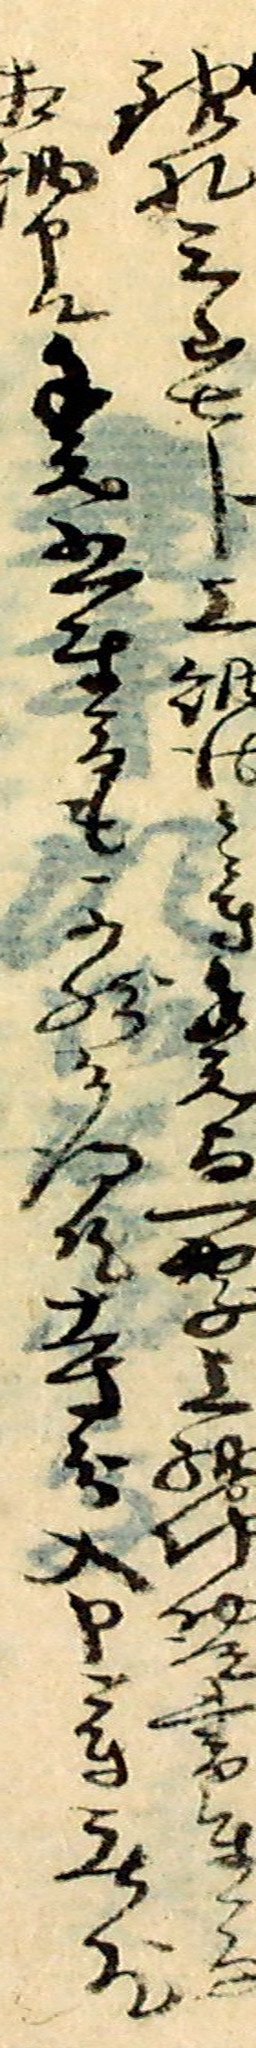相納申候手元書付にても可然候得共寺分入申に付庄屋
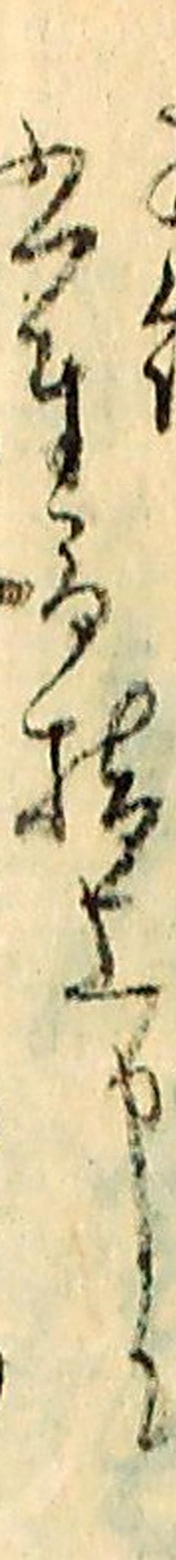書付にて指上申候
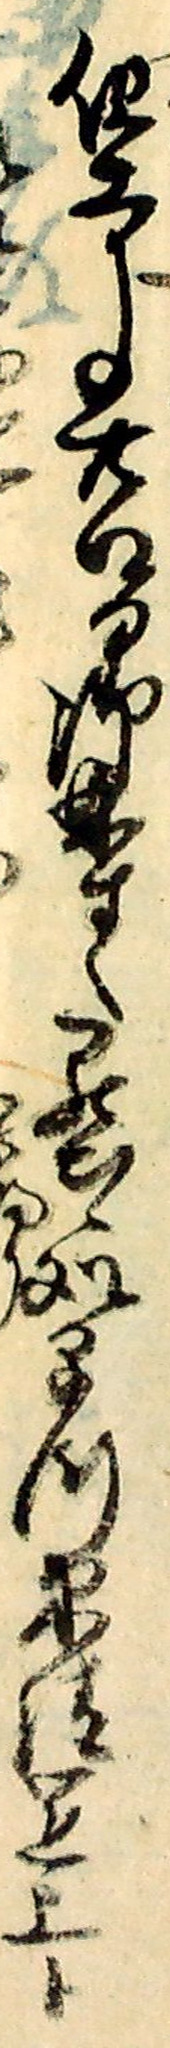但十一月廿四日御林方へ罷出候処早淵束請運上と
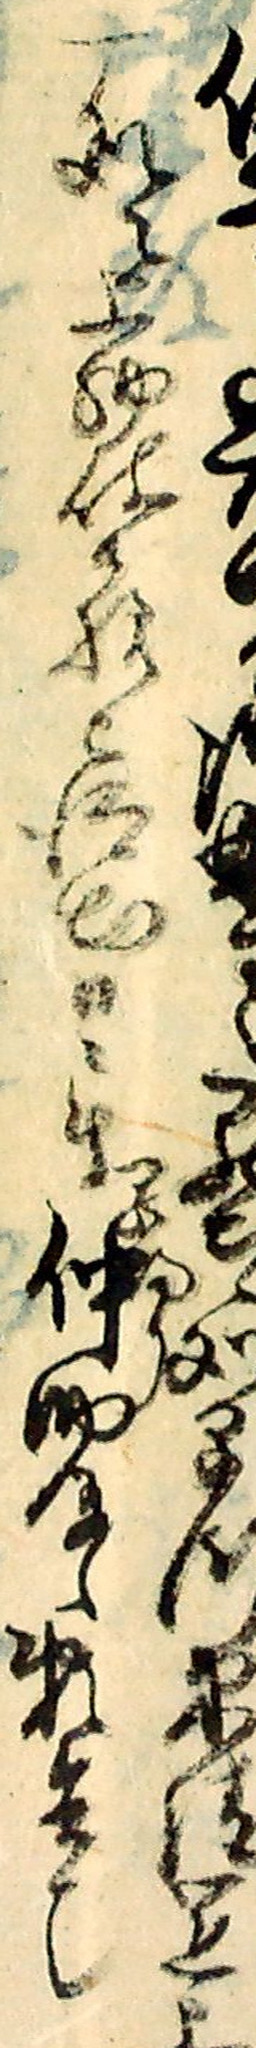一処に上納仕候様被仰出候に付罷帰り仲助殿へ頼置申候
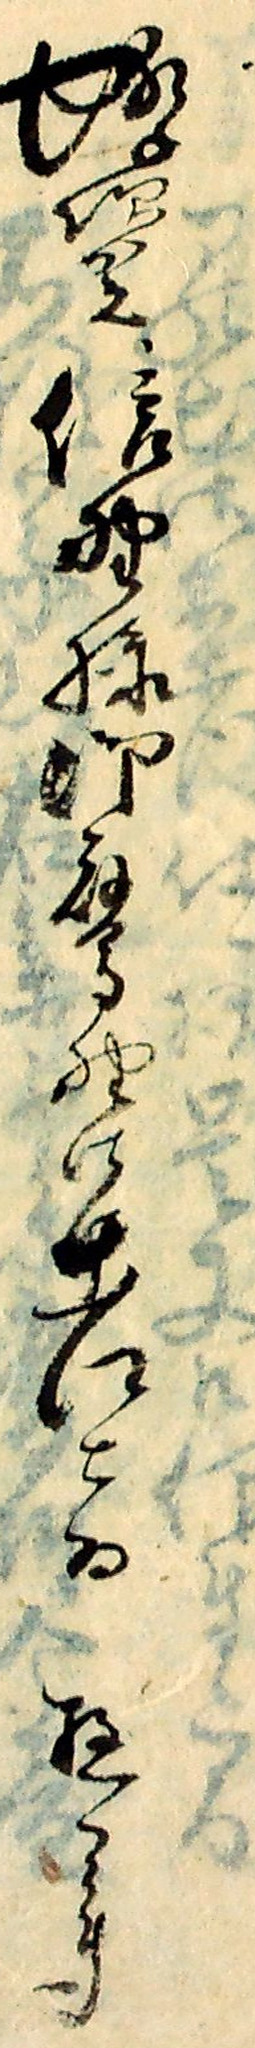蜂須賀信濃様御鷹野御出郷被為遊候に付
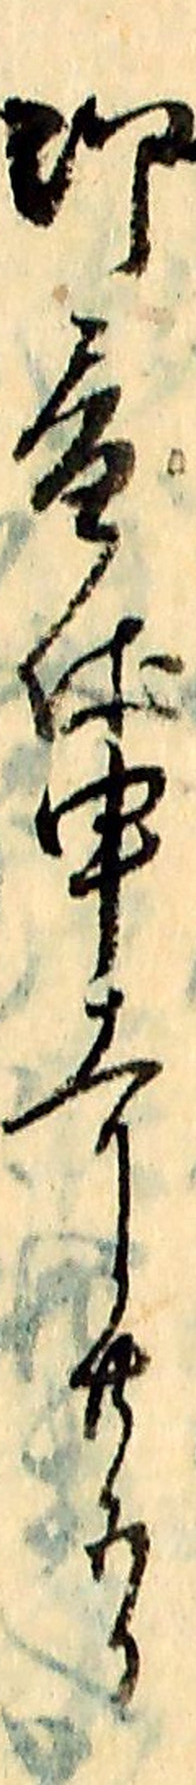御昼休申十一月廿五日
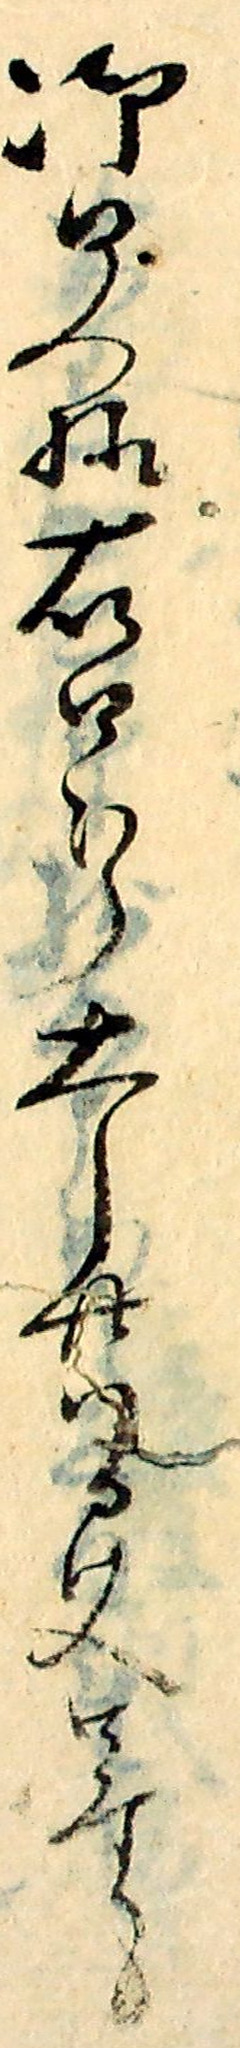御同人様右同断十一月廿八日御入御座候

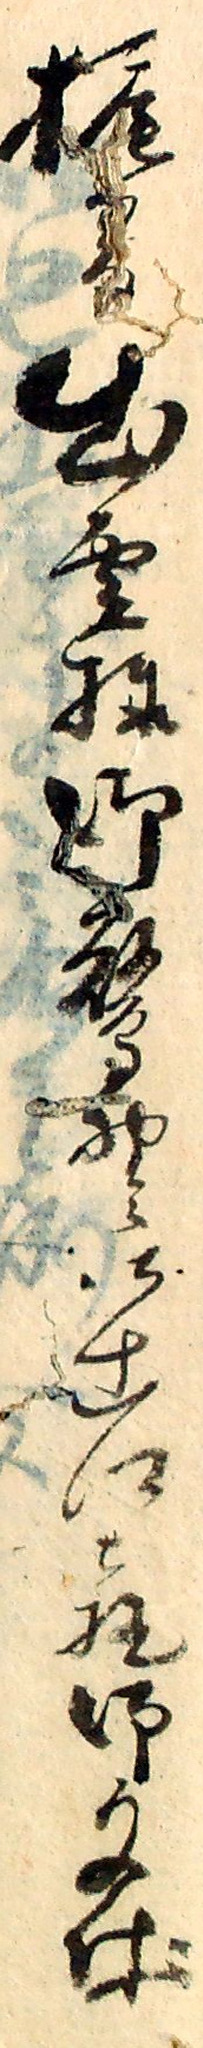梶間出雲様御鷹野に御出郷被遊御夕休
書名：諸御願書控(後藤氏壱番）
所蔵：鳴門教育大学 Naruto University of Education
